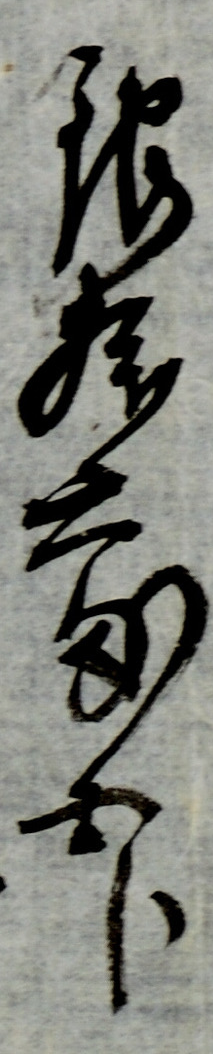銀拾六匁五ト
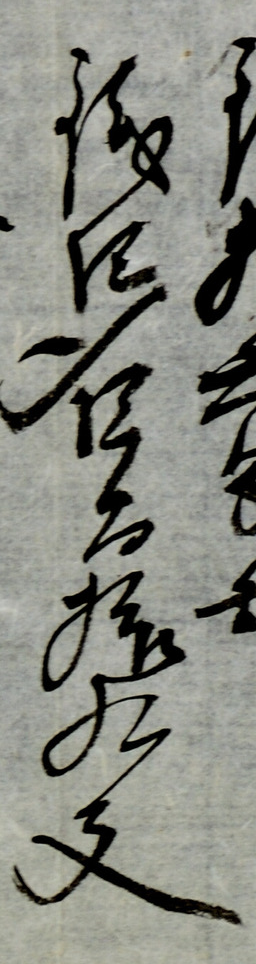銭四〆四百拾九文
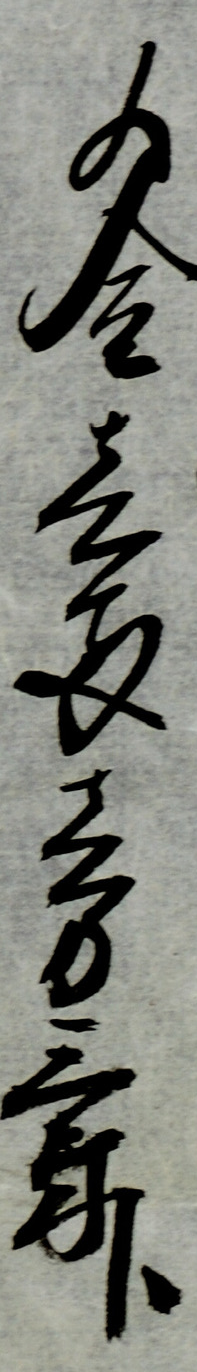入金壱両壱分三朱ト
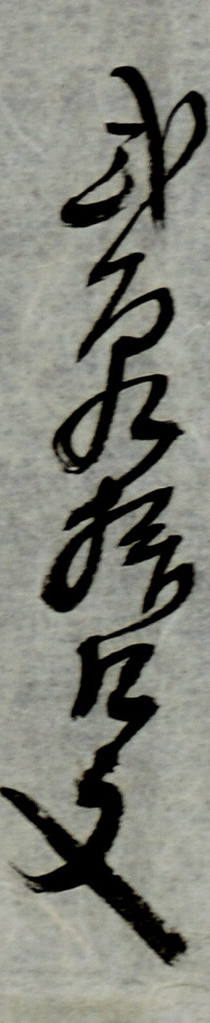弐百九拾四文
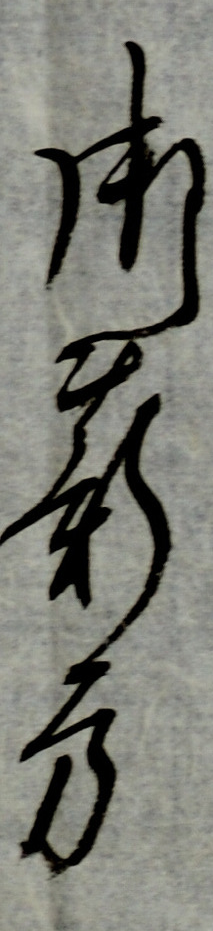御薪方
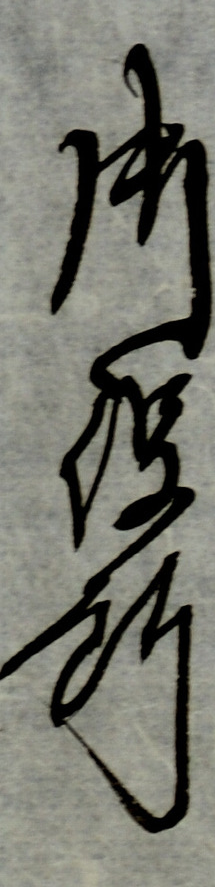御役所

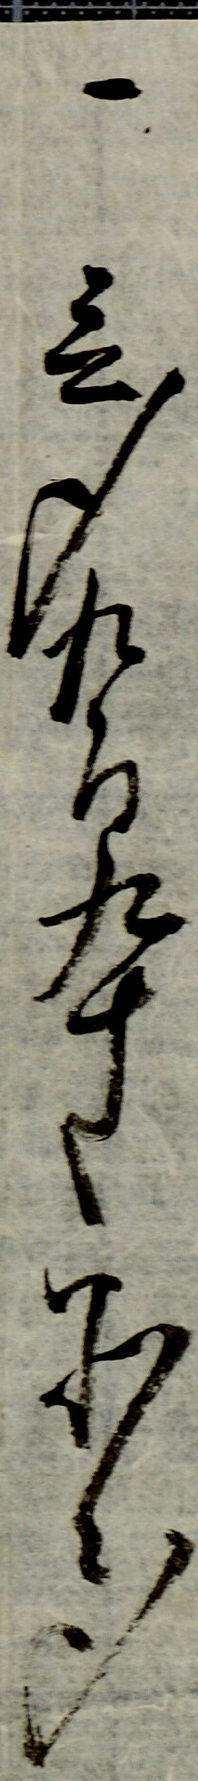一壱貫九百九十文〆
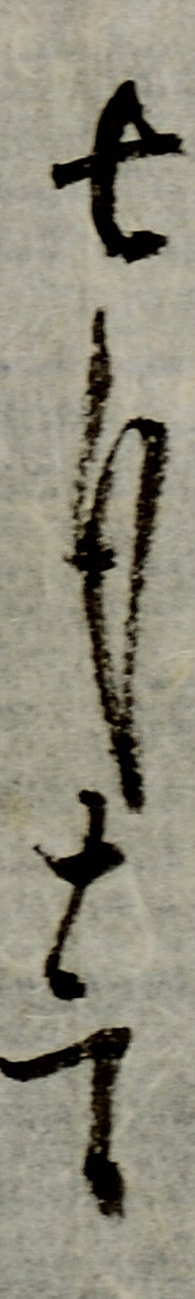七月十二日
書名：御山方御拂物代料取立帳
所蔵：伊那市立高遠町図書館・合同会社AMANE
